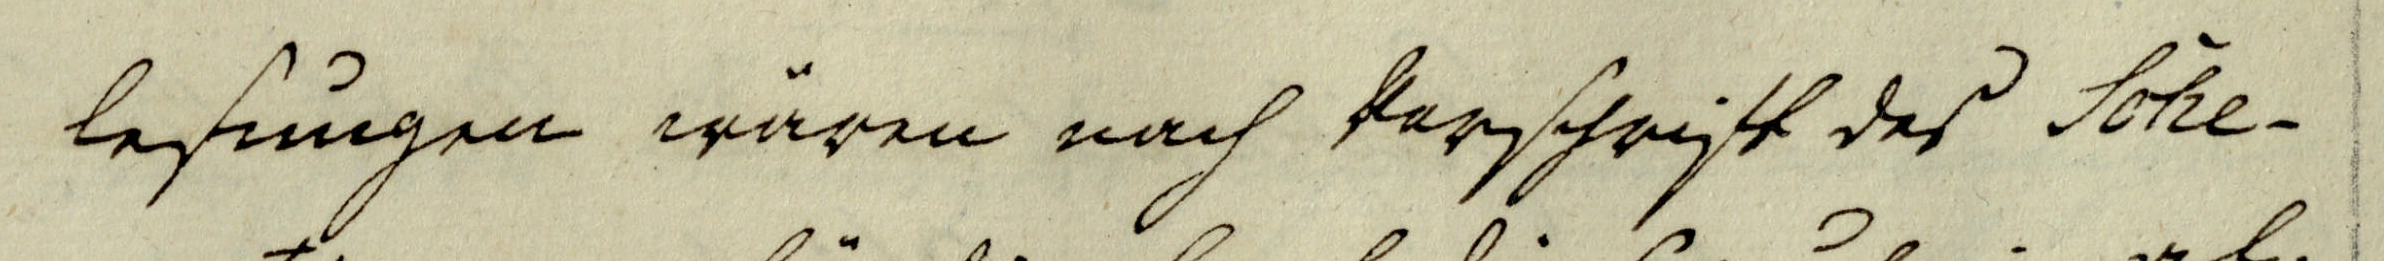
lesungen wären nach Vorschrift des Sche¬
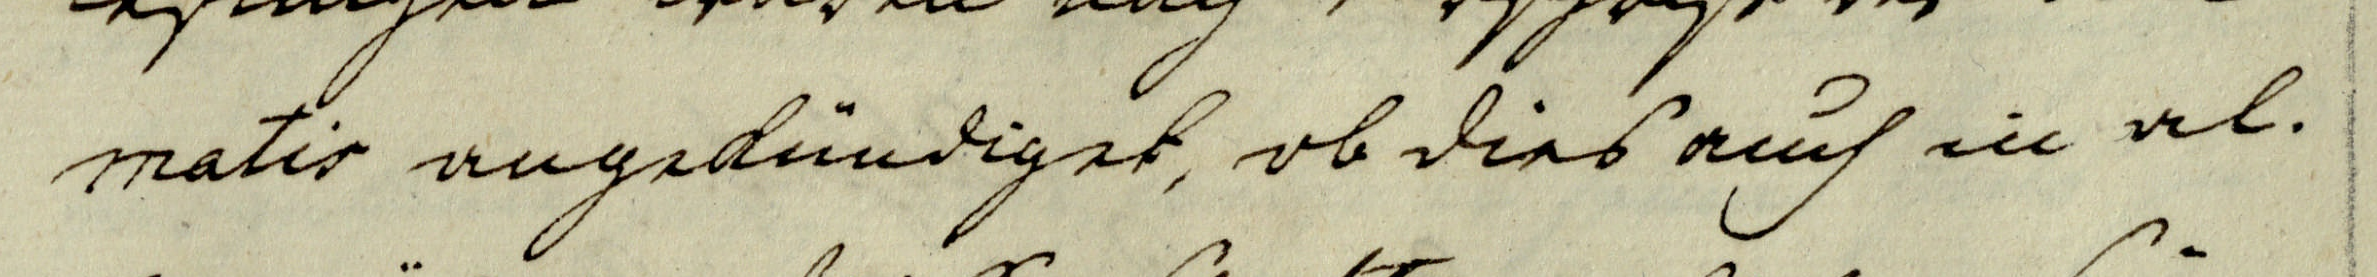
matis angekündiget, ob dies auch in al¬
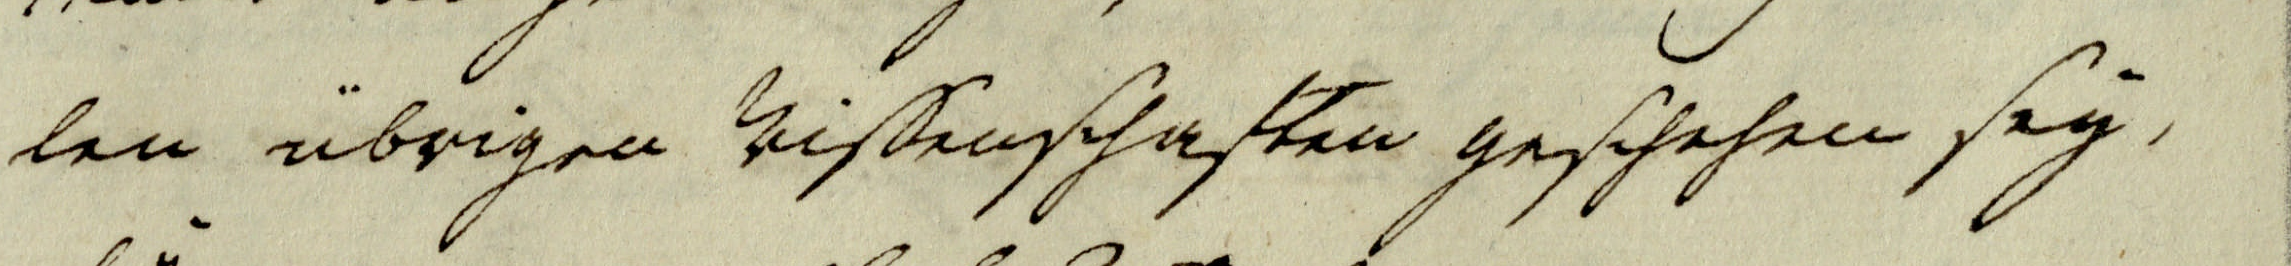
len übrigen Wissenschaften geschehen seÿ,
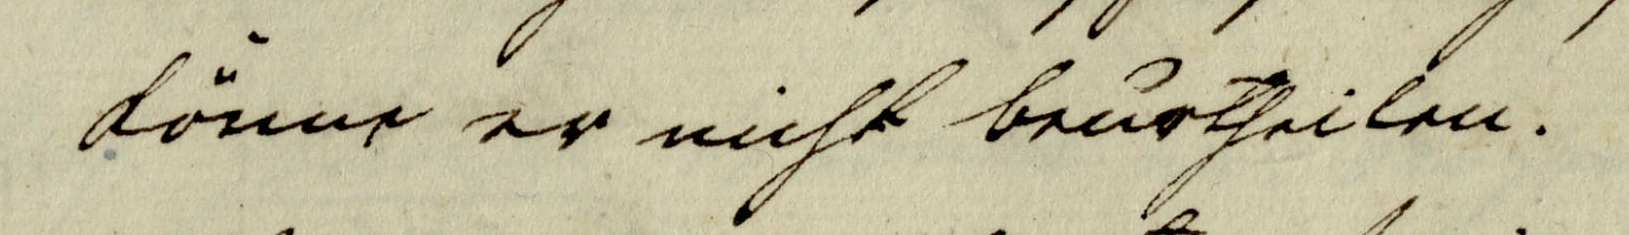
könne er nicht beurtheilen.
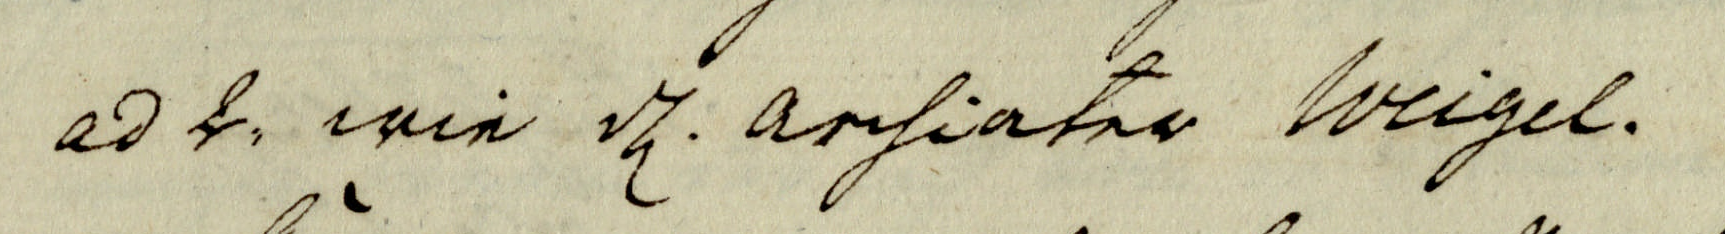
ad 2. wie dh. Archiater Weigel.
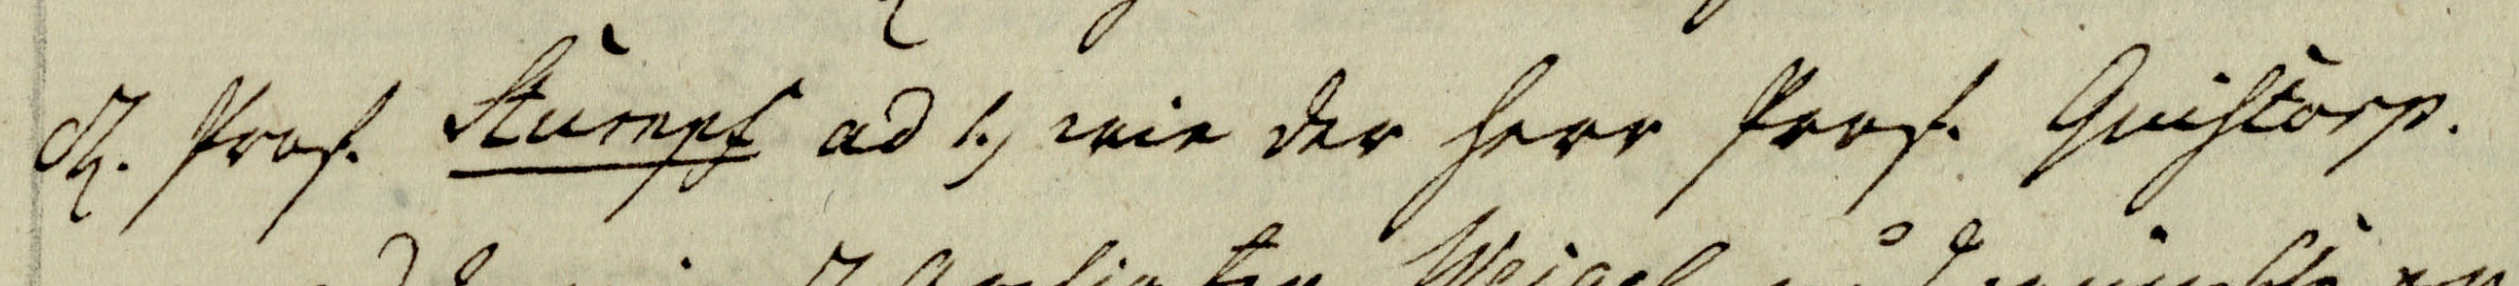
dh. Prof. Stumpf ad 1., wie der Herr Prof. Quistorp.
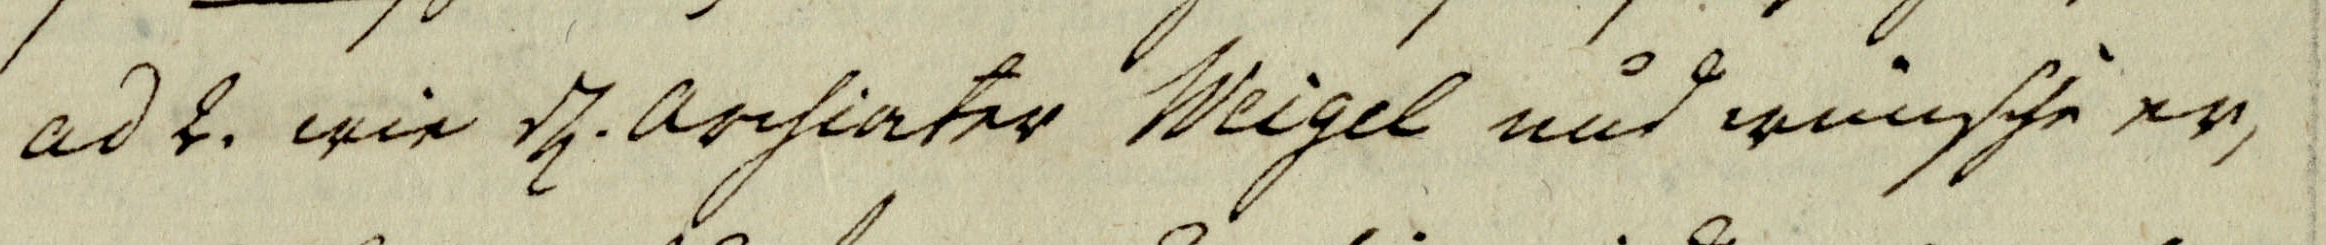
ad 2. wie dh. Archiater Weigel und wünsche er,
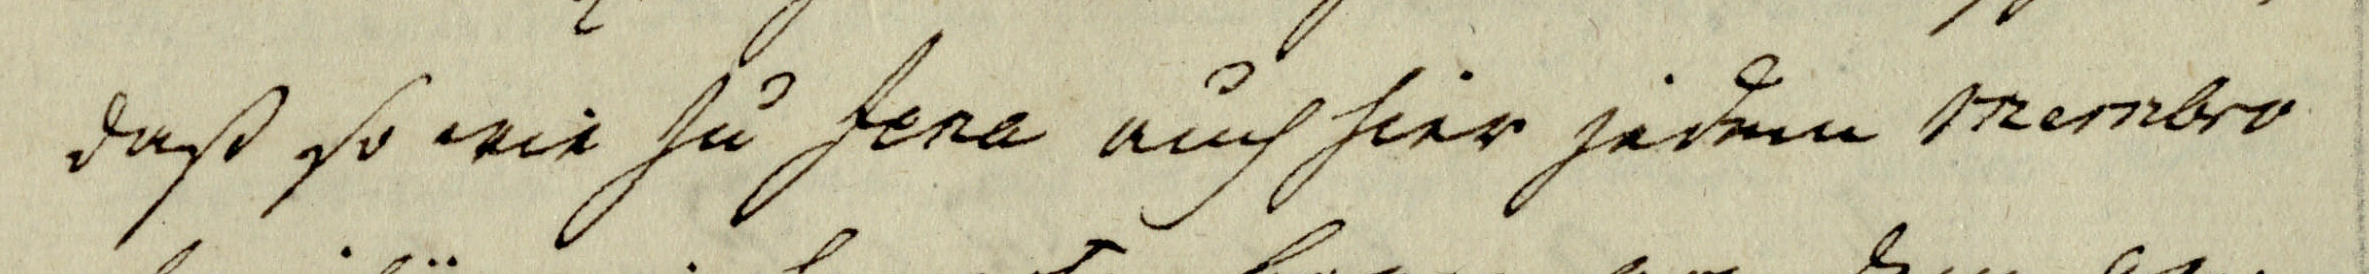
daß so wie zu Jena auch hier jedem membro
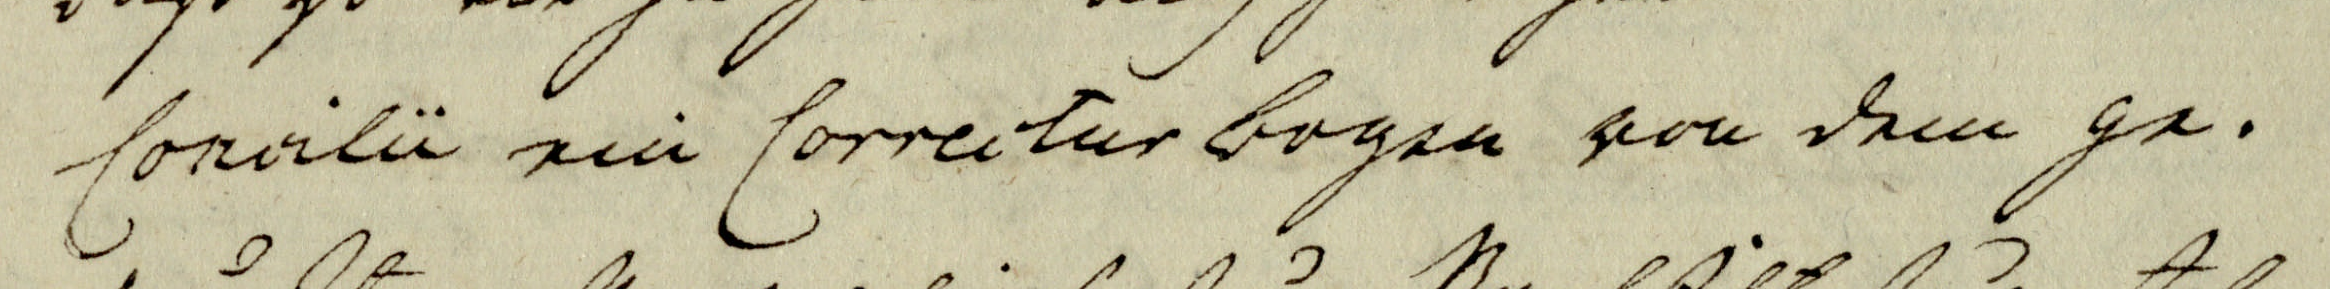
Concilii ein Correctur Bogen von dem ge¬
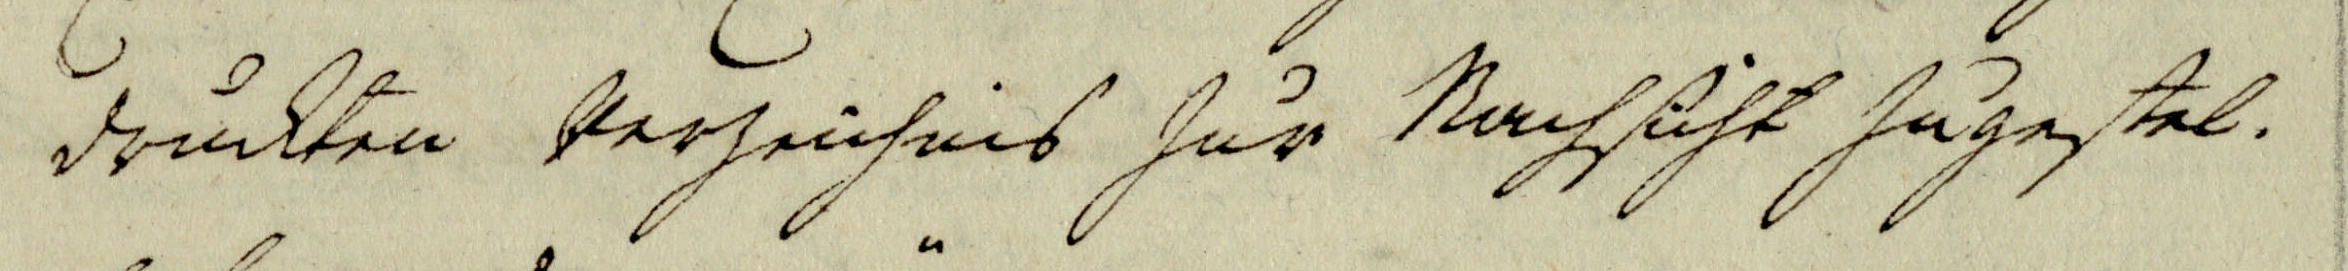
druckten Verzeichnis zur Nachsicht zugestel¬
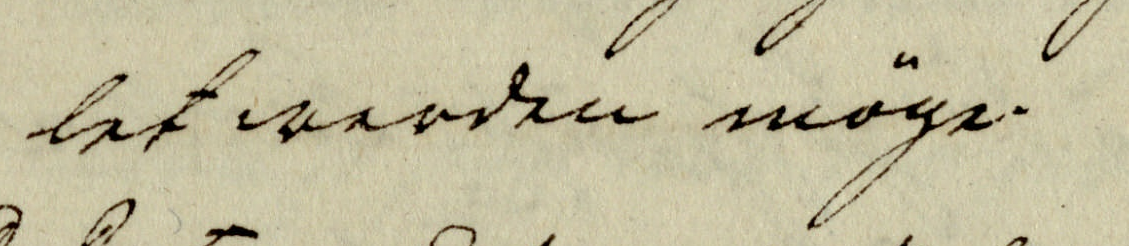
let werden möge.
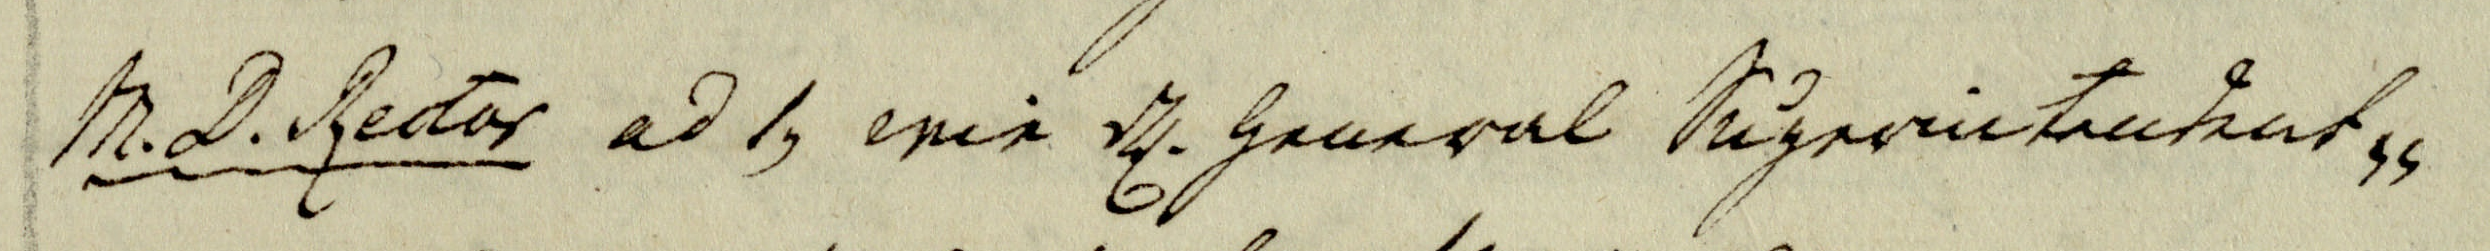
M. D. Rector ad 1., wie dh. General Superintendent
